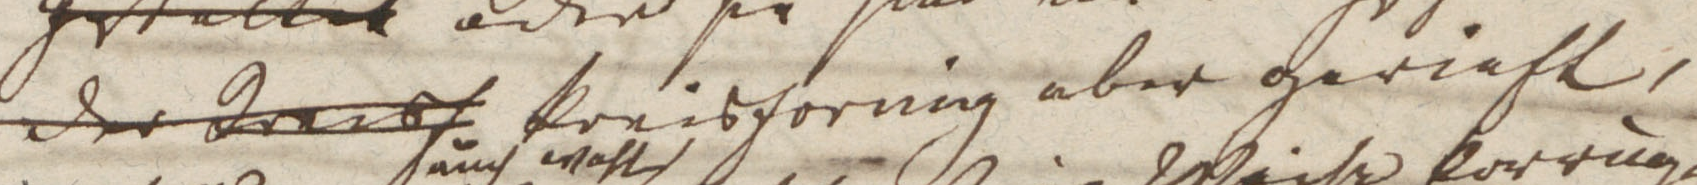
der Kreisf kreisformig aber gerieft,
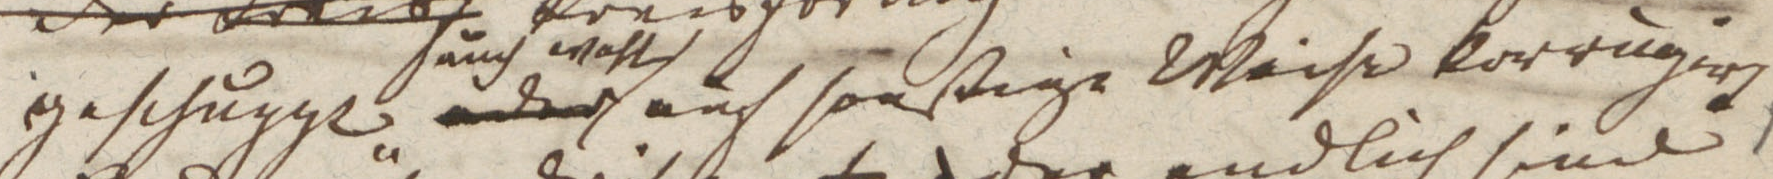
geschuppt oder auch wohl auf sonstige Weise korrugirt,
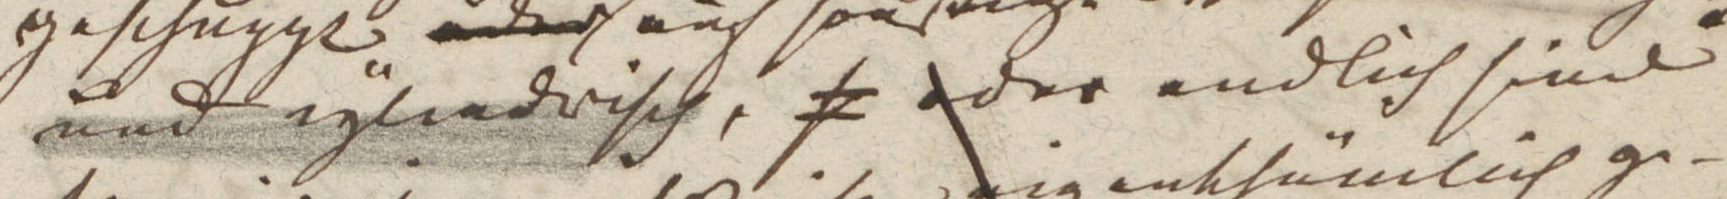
und cylindrisch, s oder endlich sind
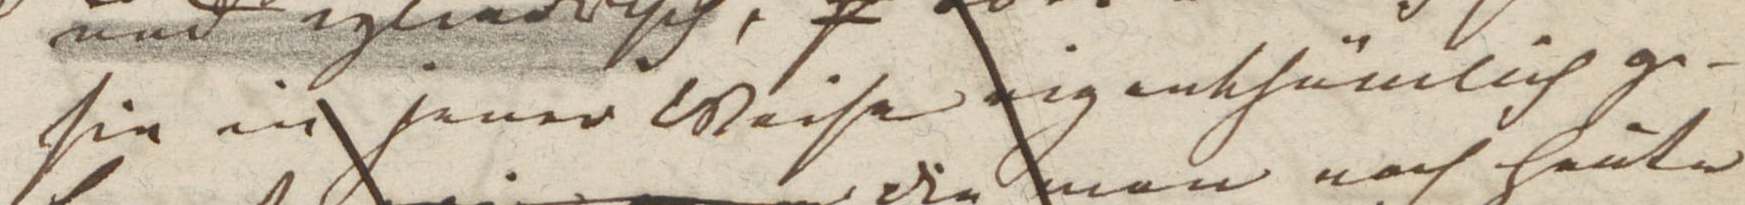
sie in jener Weise eigenthümlich ge-
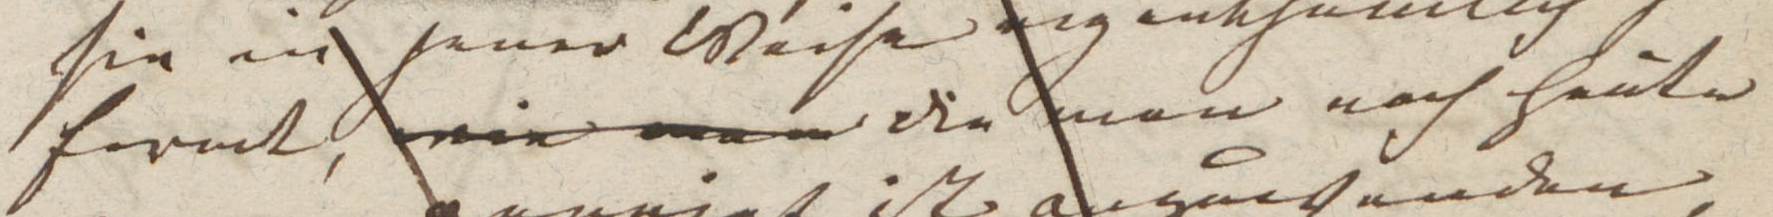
formt, wie man die man noch heute
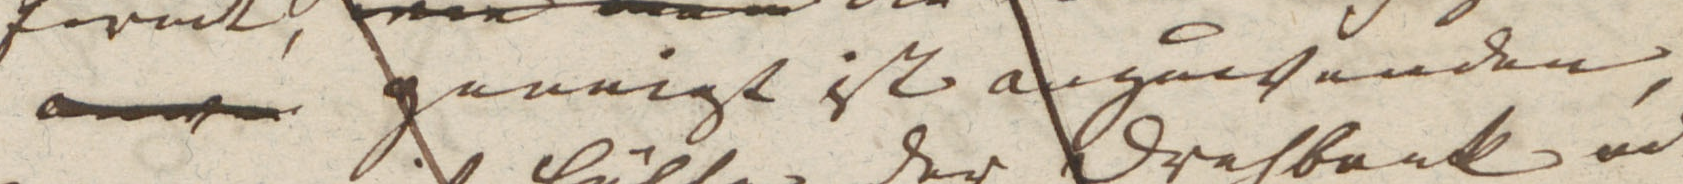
anwe geneigt ist anzuwenden,
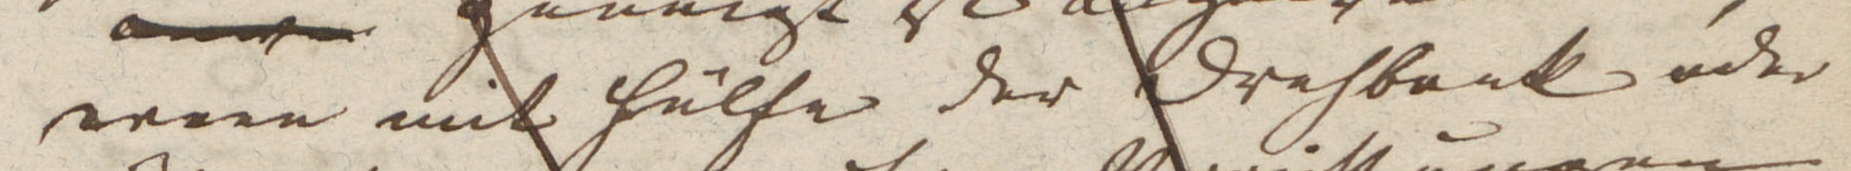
wenn mit Hülfe der Drehbank oder
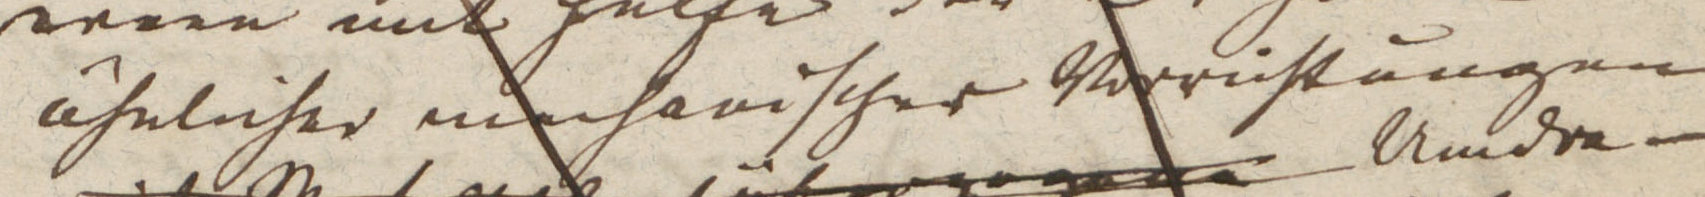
ähnlicher mechanischer Vorrichtungen
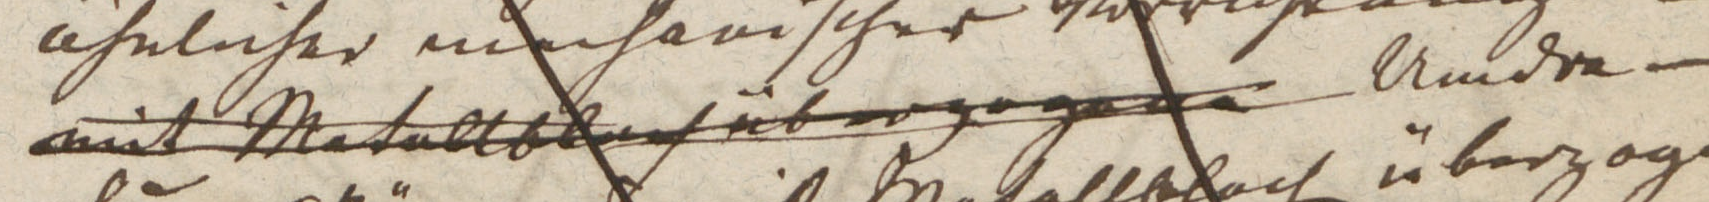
mit Metallblech überzogene Umdre-
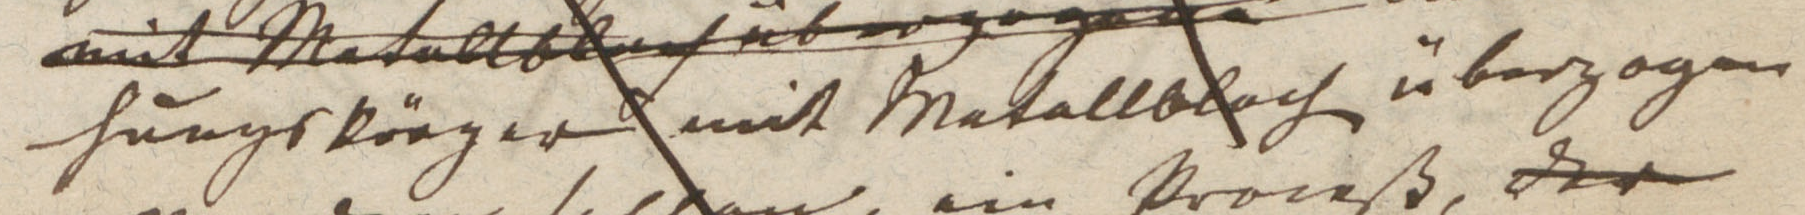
hungskörper mit Metallblech überzogen
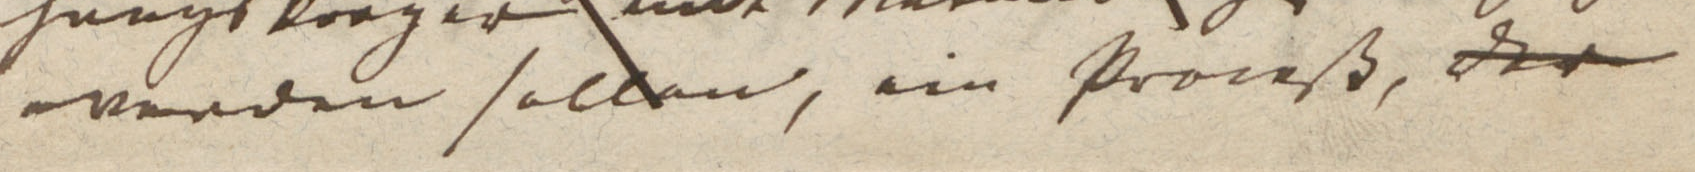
werden sollen, ein Process, der
